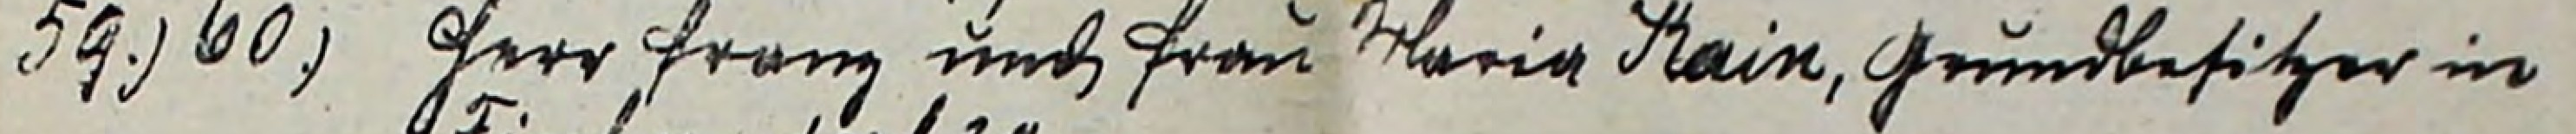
59.) 60.) Herr Franz und Frau Maria Kain, Grundbesitzer in
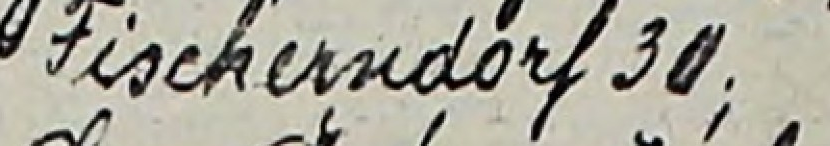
Fischerndorf 30;
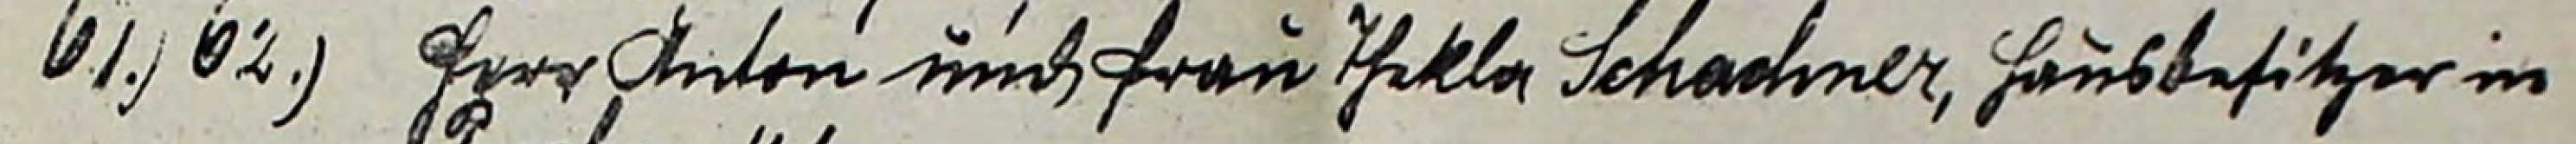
61.) 62.) Herr Anton und Frau Thekla Schachner, Hausbesitzer in
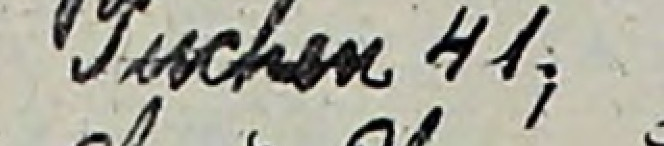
Puchen 41;
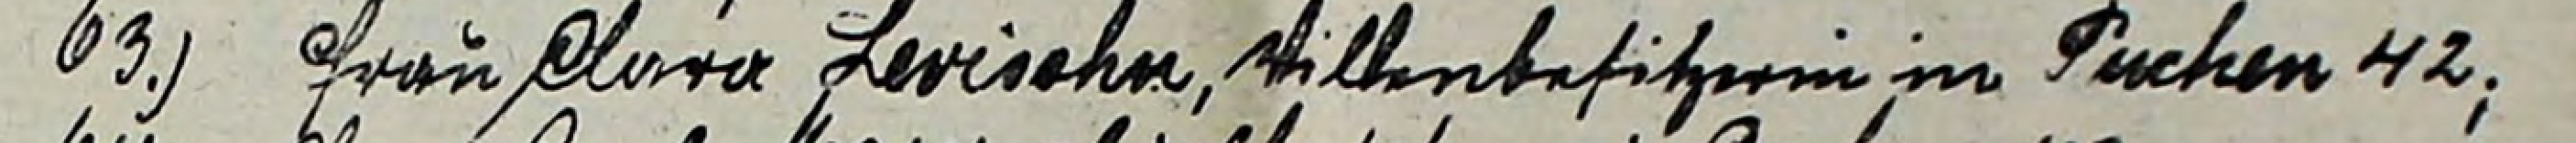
63.) Frau Clara Levisohn, Villenbesitzerin in Puchen 42;
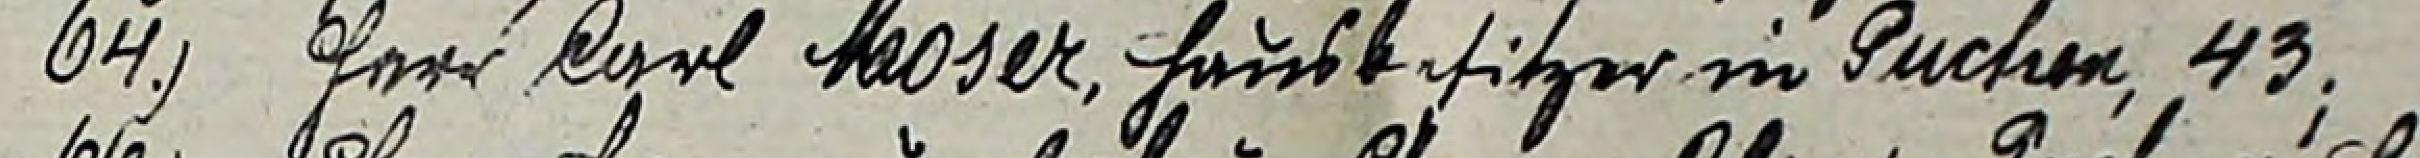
64.) Herr Carl Moser, Hausbesitzer in Puchen, 43;
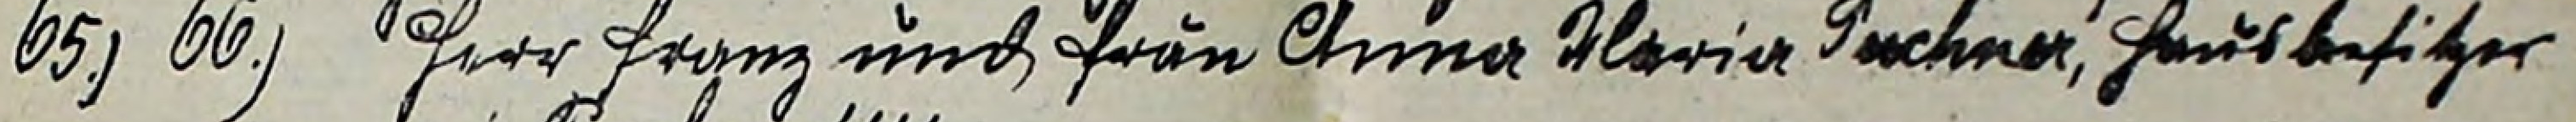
65.) 66.) Herr Franz und Frau Anna Maria Puchner, Hausbesitzer
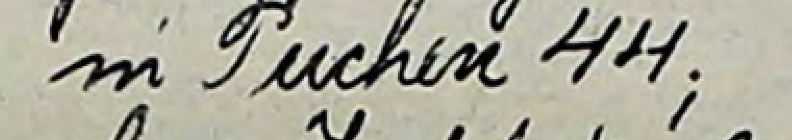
in Puchen 44;
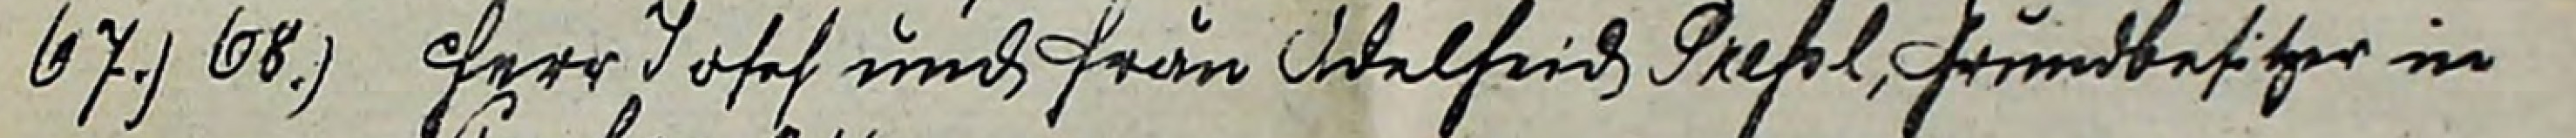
67.) 68.) Herr Josef und Frau Adelheid Pressl, Grundbesitzer in
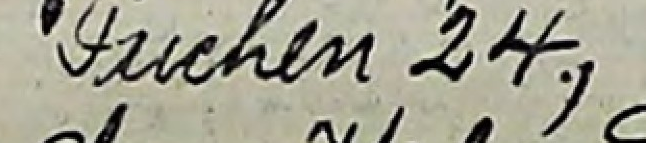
Puchen 24;
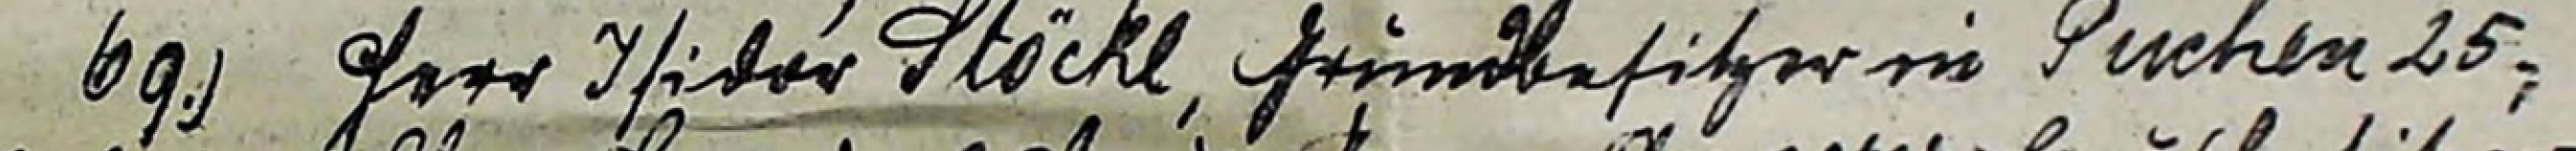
69.) Herr Isidor Stöckl, Grundbesitzer in Puchen 25;
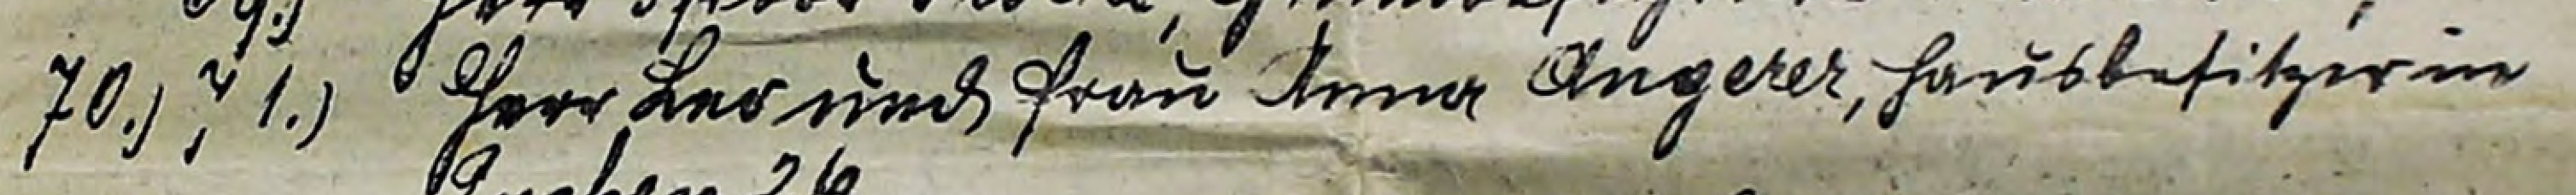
70.) 71.) Herr Leo und Frau Anna Angerer, Hausbesitzer in
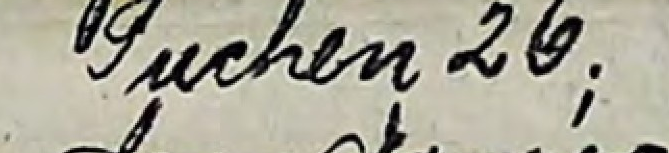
Puchen 26;
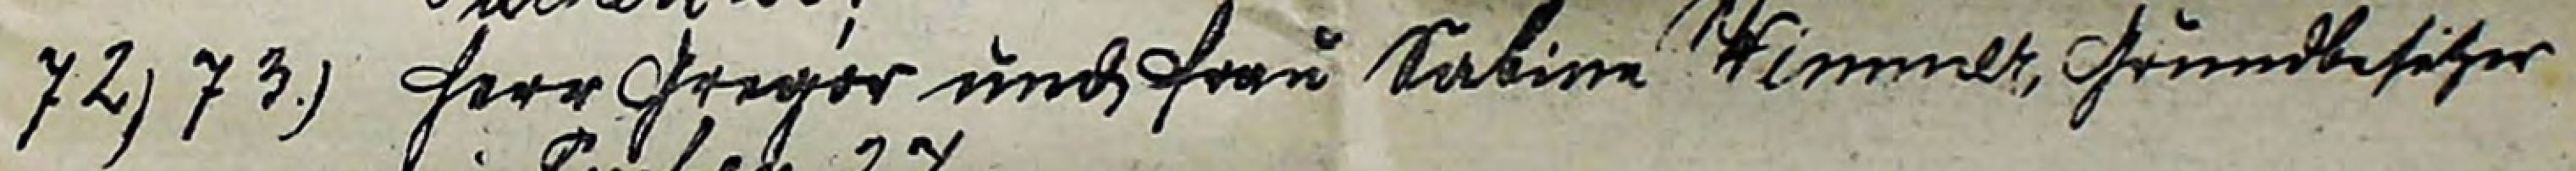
72) 73.) Herr Gregor und Frau Sabine Wimmer, Grundbesitzer
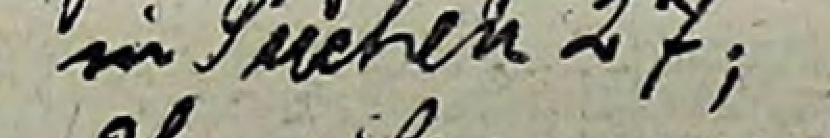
in Puchen 27;
